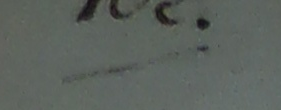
102.
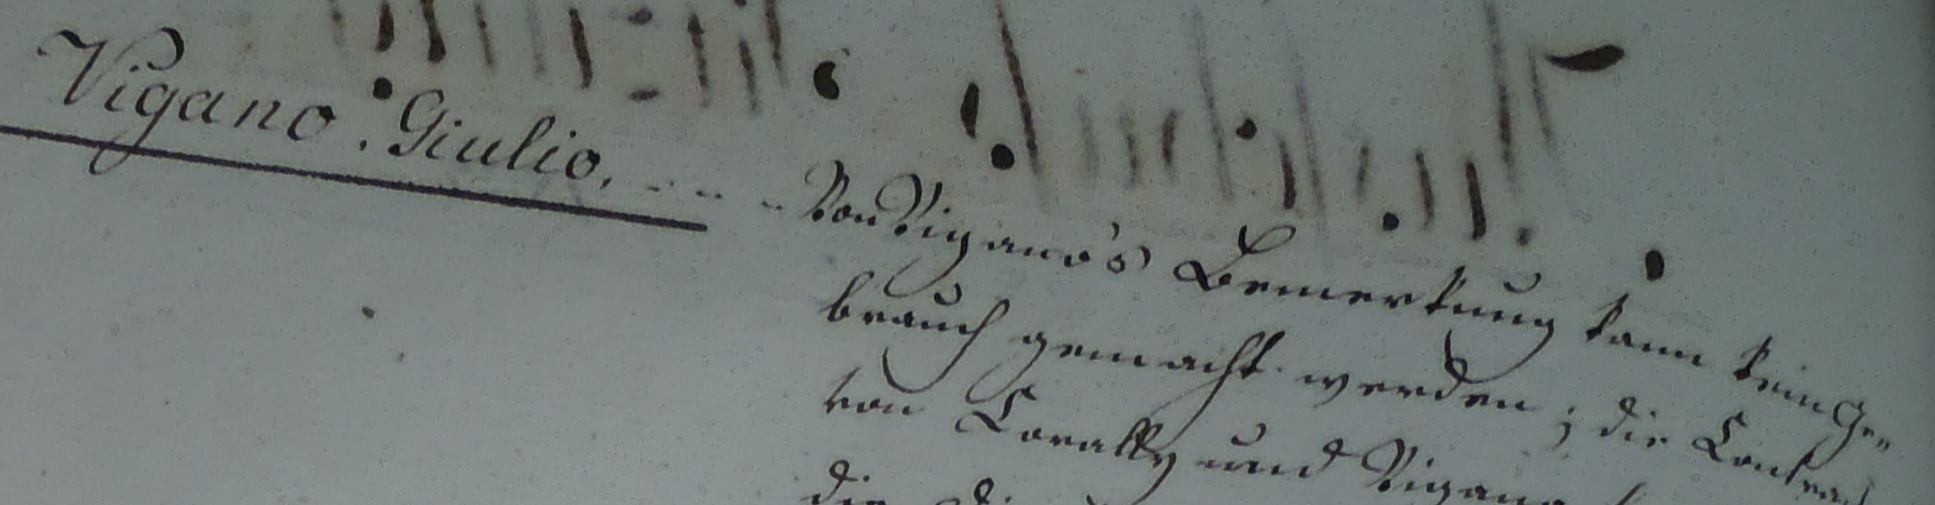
Vigano, Giulio, .. .. .. Von Vigano's Bemerkung kann kein Ge¬
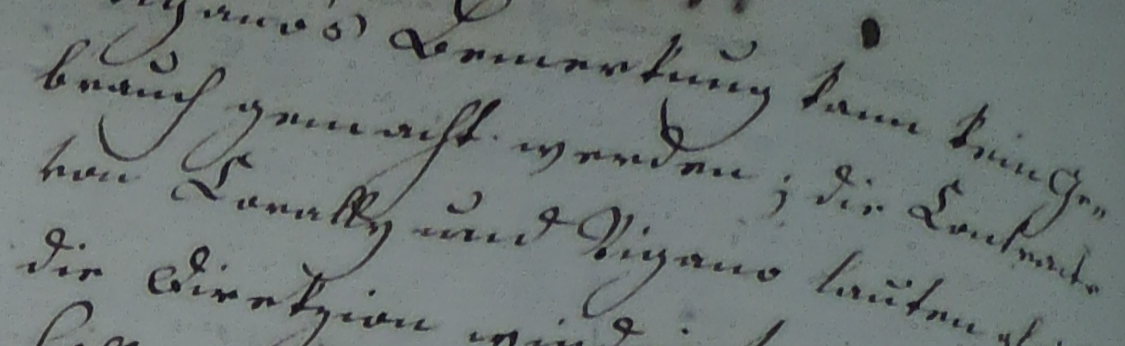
brauch gemacht werden; die Contracte
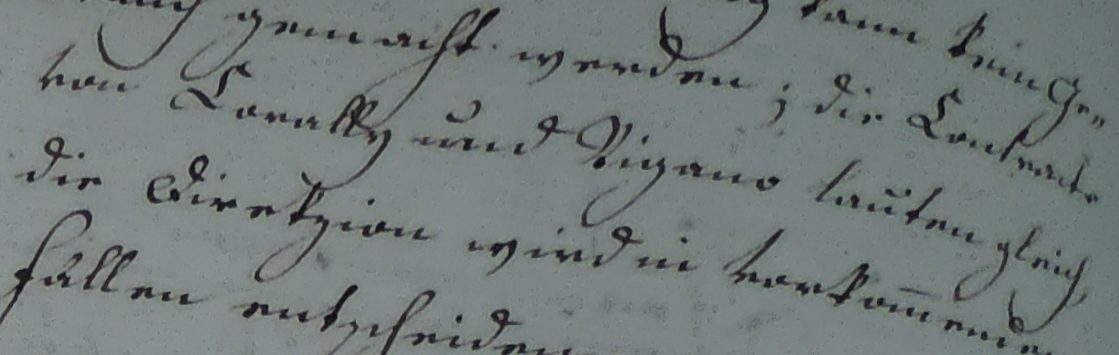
von Corally und Vigano lauten geich
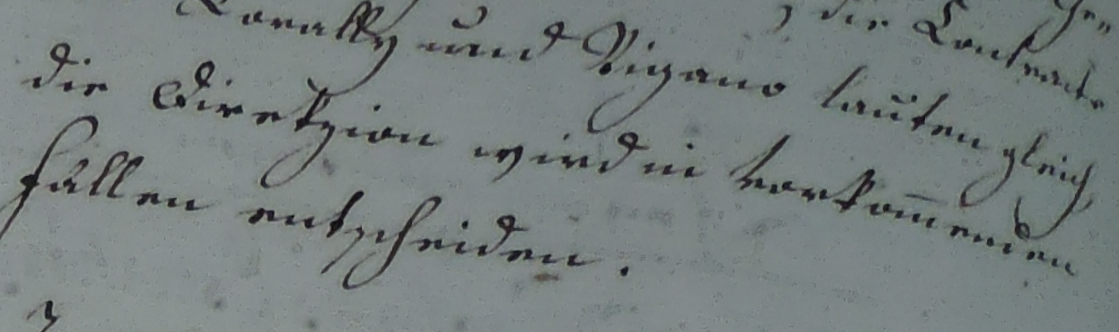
die Direkzion wird in vorkom̅enden
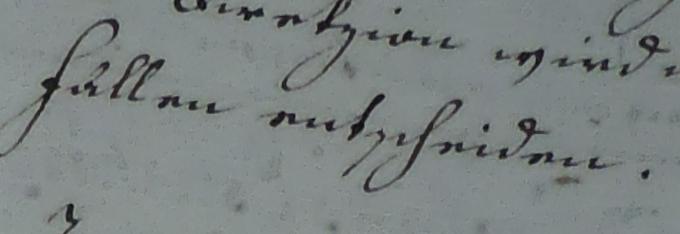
Fällen entscheiden.
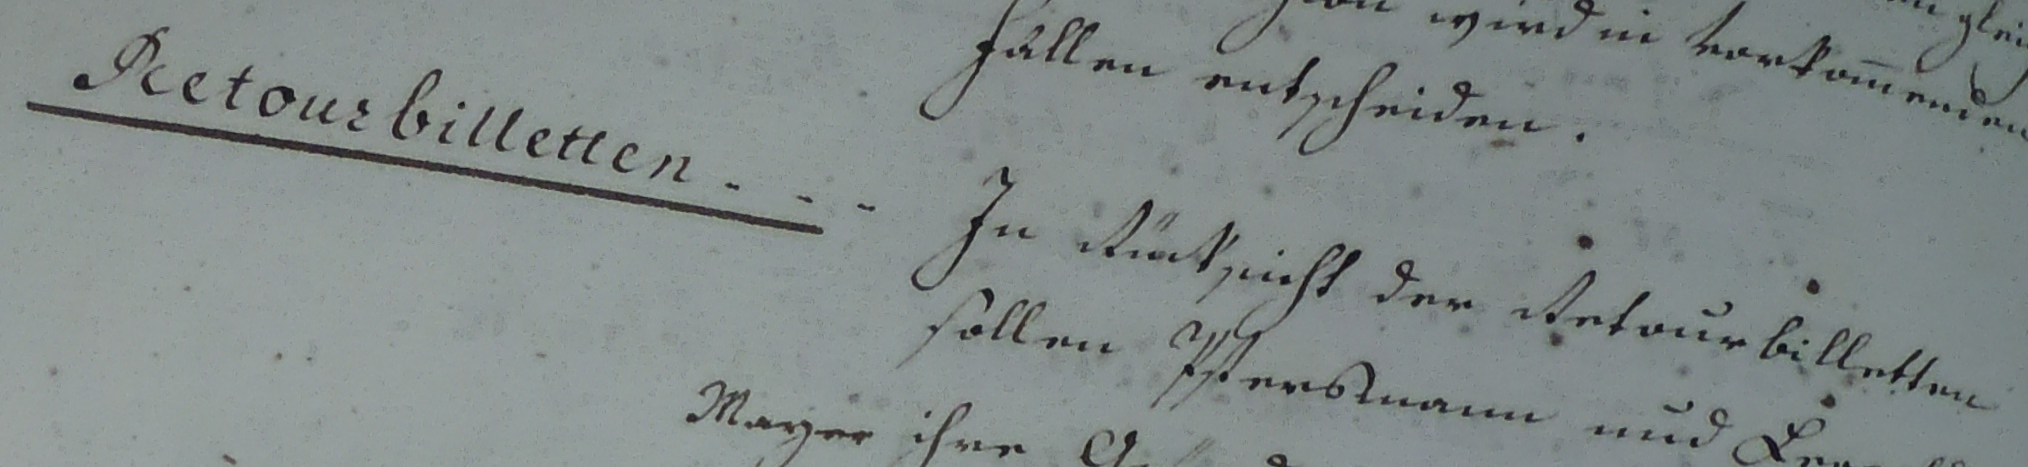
Retourbilletten .. .. .. In Rücksicht der Retourbilletten
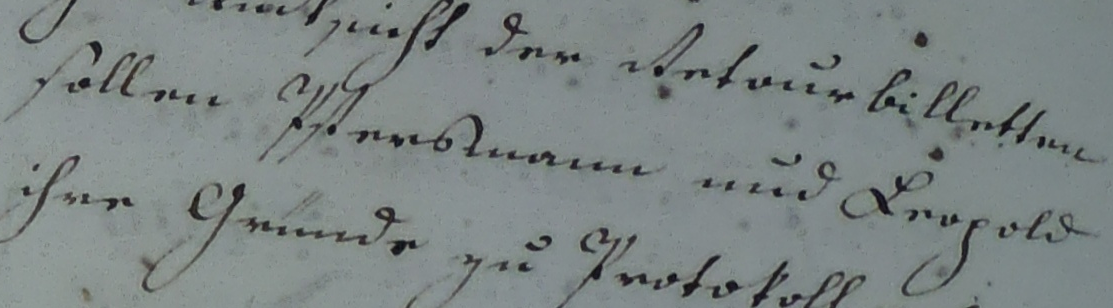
sollen Pfersmann und Leopold
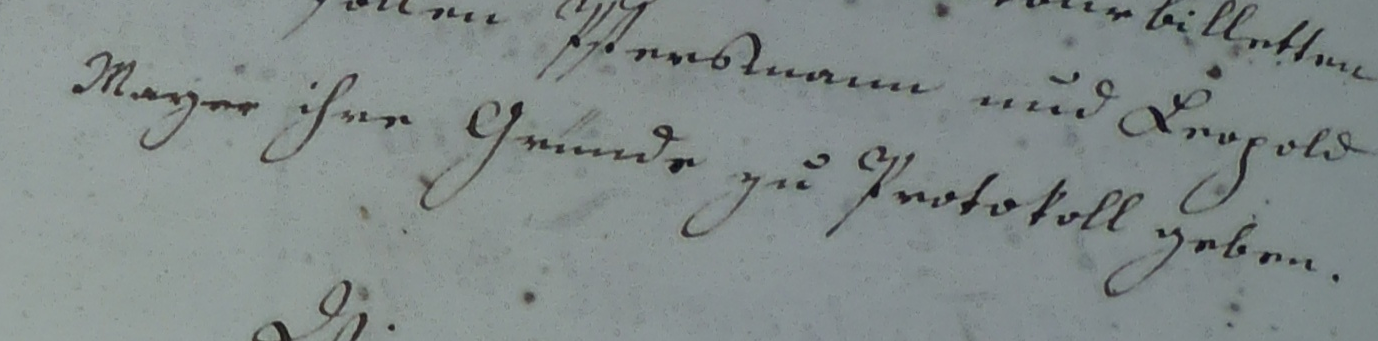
Mayer ihre Gründe zu Protokoll geben.
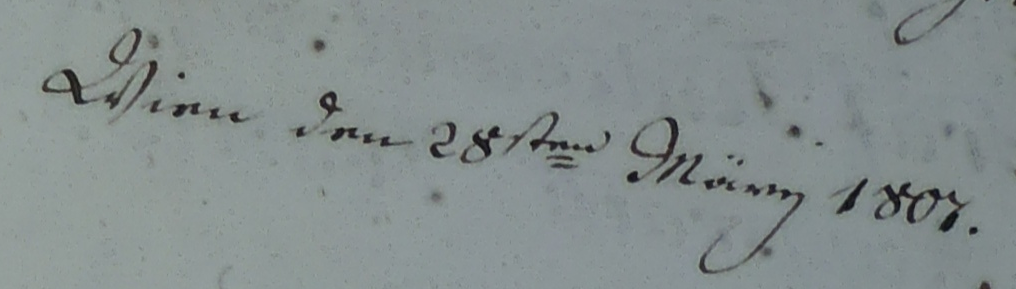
Wien den 28ste͇n März 1807.
